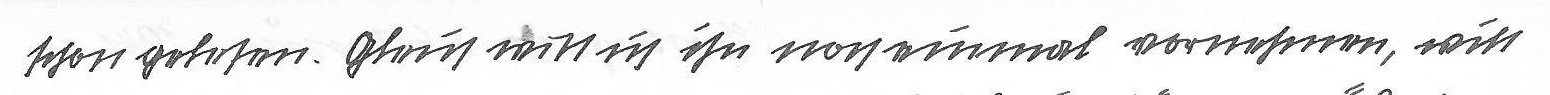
schon gelesen. Gleich will ich ihn noch einmal vornehmen, will
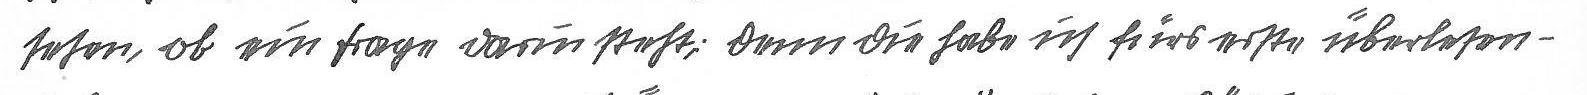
sehen, ob ein Frage darin steht; denn die habe ich fürs erste überlesen –
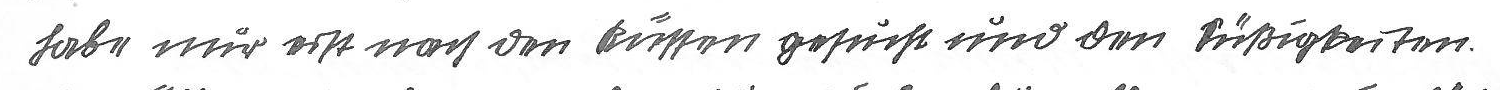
habe nur erst nach den Küssen gesucht und den Süßigkeiten.
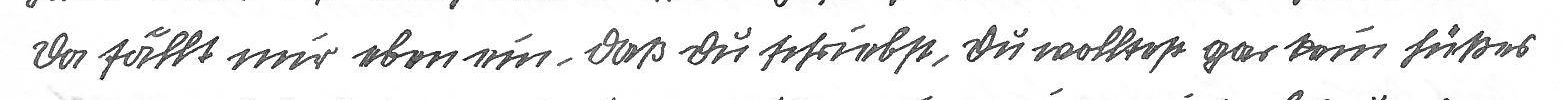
Da fällt mir eben ein, daß Du schriebst, Du wolltest gar kein süßes
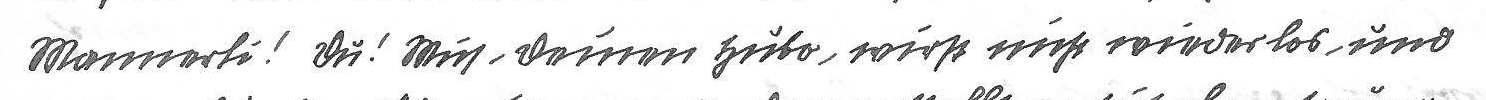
Mannerli! Du! Mich, Deinen Hubo, wirst nicht wieder los, und
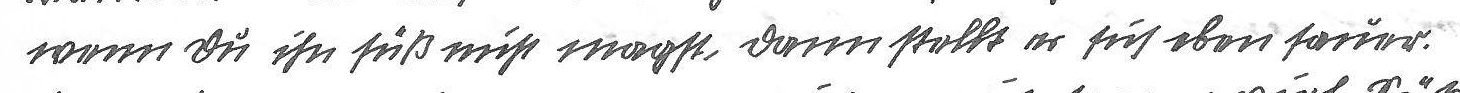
wenn Du ihn süß nicht magst, dann stellt er sich eben sauer.
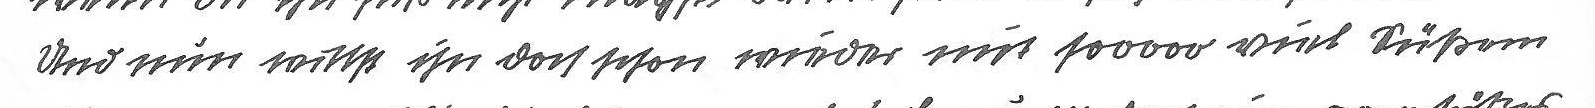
Und nun willst ihn doch schon wieder mit sooooo viel Süßem
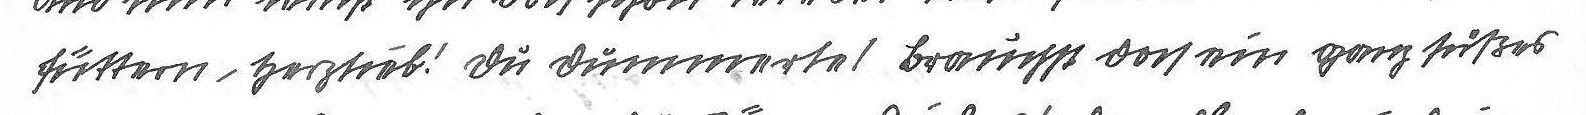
füttern, Herzlieb! Du Dummerle! Brauchst doch ein ganz süßes
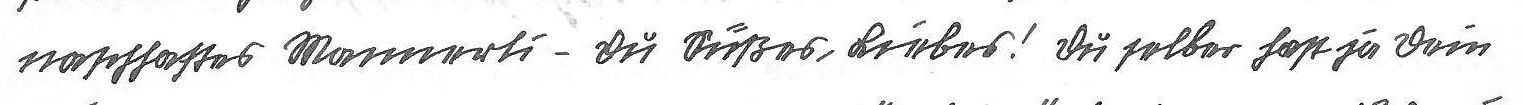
naschhaftes Mannerli – Du Süßes, Liebes! Du selber hast ja Dein
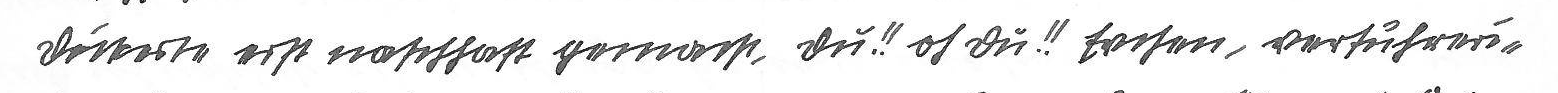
Dickerle erst naschhaft gemacht, Du!! oh Du!! Evchen, verführeris¬
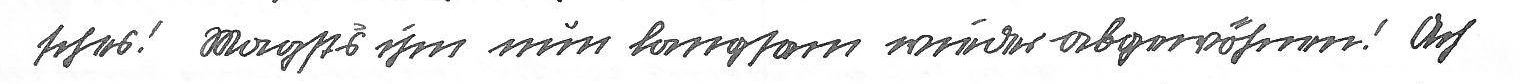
ches! Magsts ihm nun langsam wieder abgewöhnen! Ach
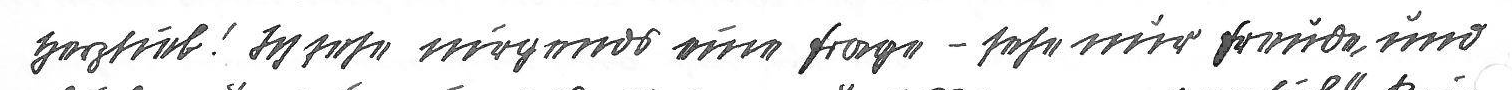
Herzlieb! Ich sehe nirgends eine Frage – sehe nur Freude, und
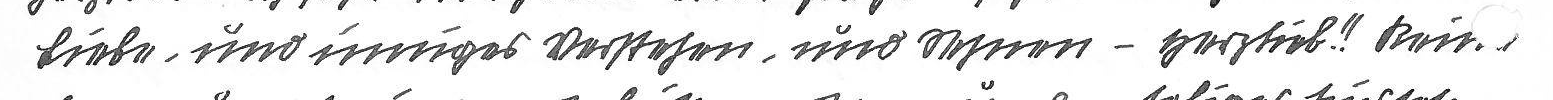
Liebe, und inniges Verstehen, und Sehnen – Herzlieb!! Keine
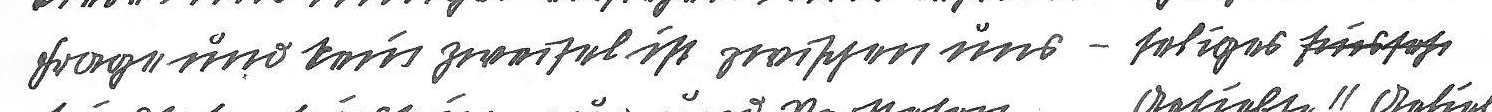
Frage und kein Zweifel ist zwischen uns – seliges Einsseh
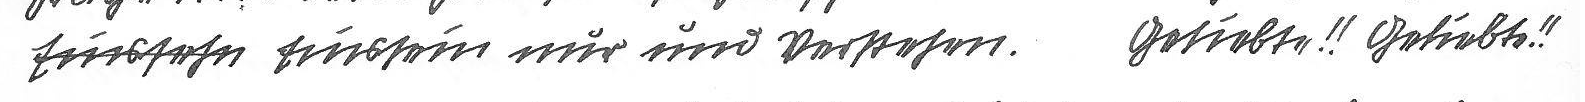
Einssehn Einssein nur und Verstehen. Geliebte!! Geliebte!!
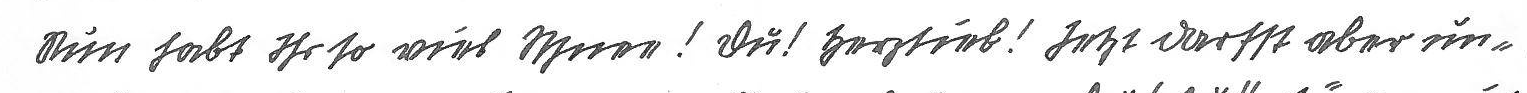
Nun habt Ihr so viel Schnee! Du! Herzlieb! Jetzt darfst aber un¬
